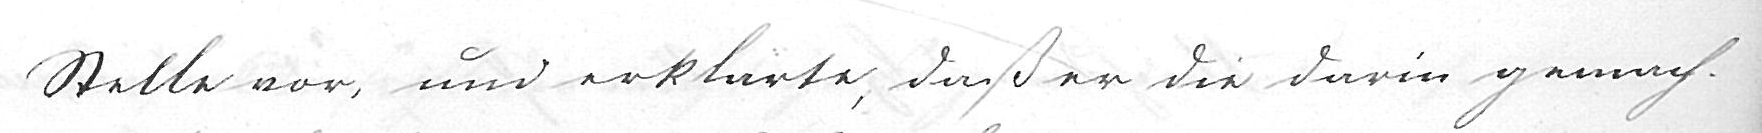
Stelle vor, und erklärte, daß er die darin gemach-
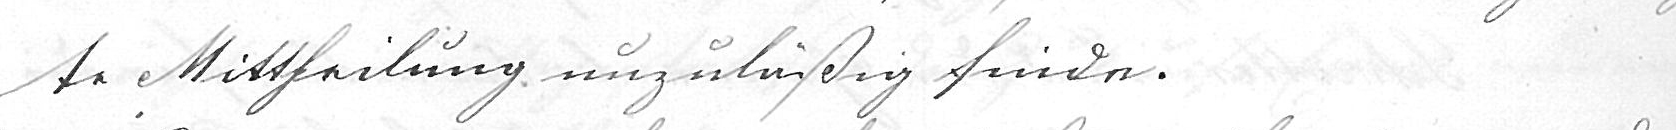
te Mittheilung unzuläßig finde.
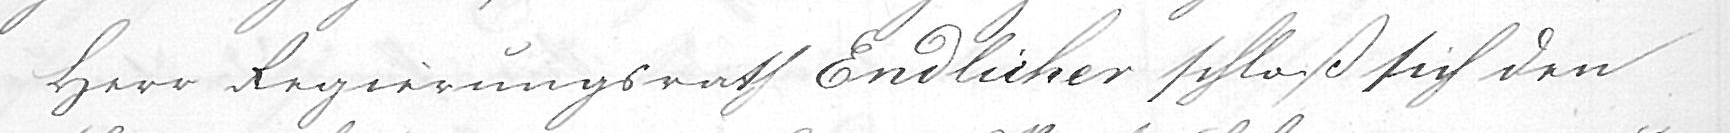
Herr Regierungsrath Endlicher schloß sich den
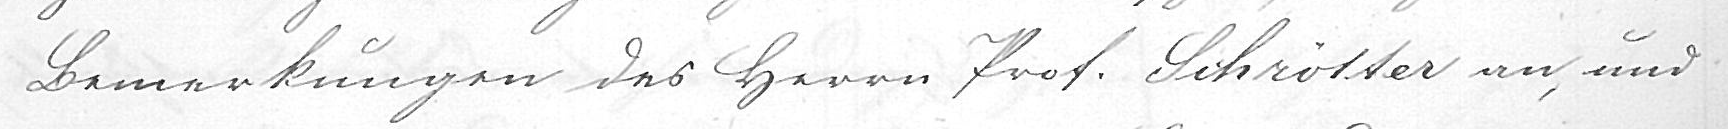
Bemerkungen des Herrn Prof. Schrötter an, und
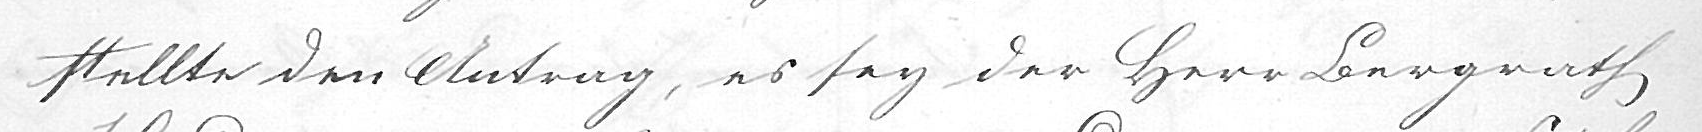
stellte den Antrag, es sey der Herrn Bergrath
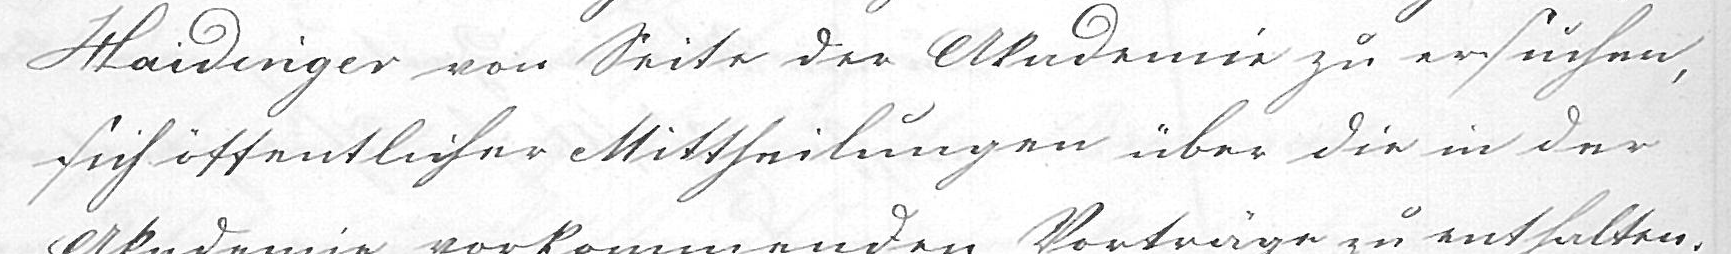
sich öffentlicher Mittheilungen über die in der
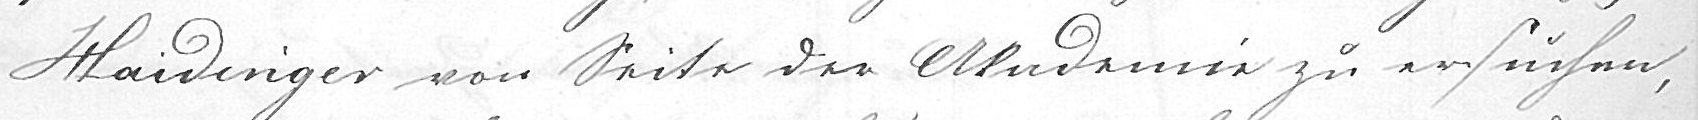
Haidinger von Seite der Akademie zu ersuchen,
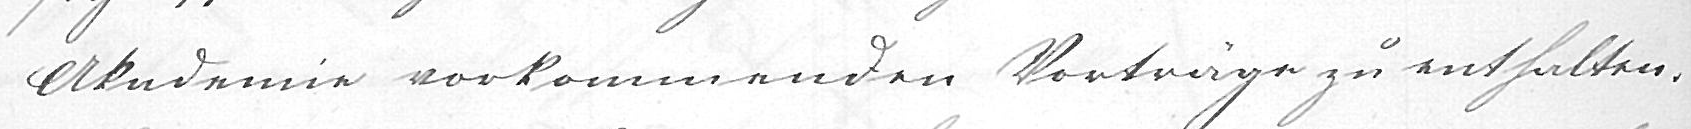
Akademie vorkommenden Vorträge zu enthalten.
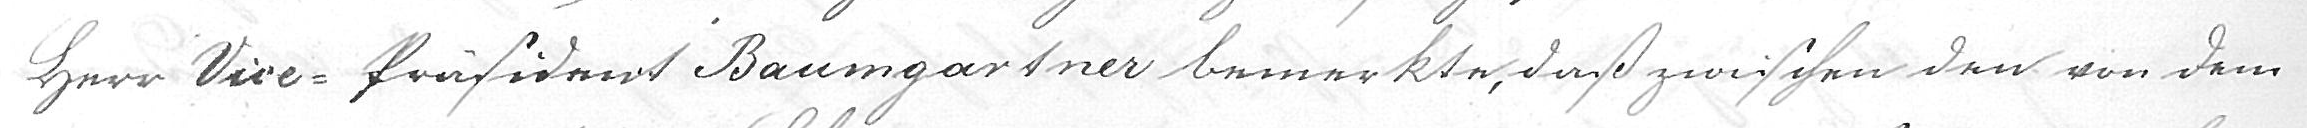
Herr Vice-Präsident Baumgartner bemerkte, daß zwischen den an den
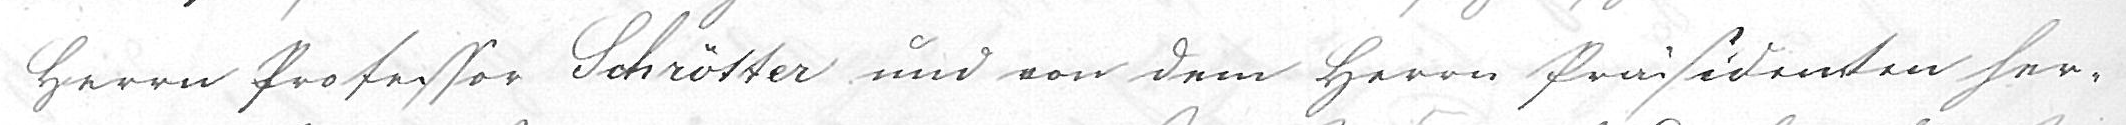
Herrn Professor Schrötter und von dem Herrn Präsidenten her-
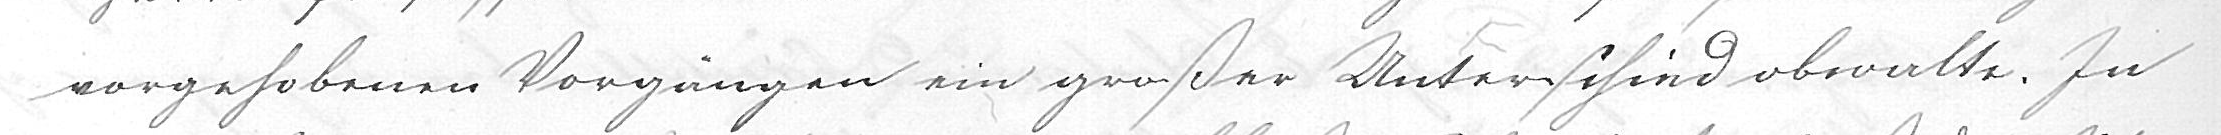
vorgehobenen Vorgängen ein großer Unterschied obwalte. In
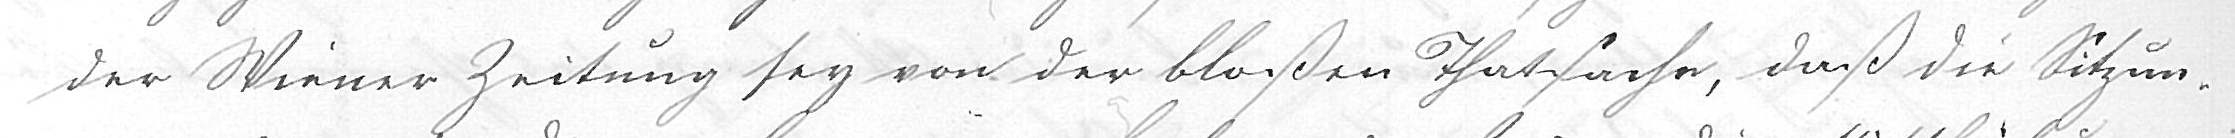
der Wiener Zeitung sey von der bloßen Thatsache, daß die Sitzun-
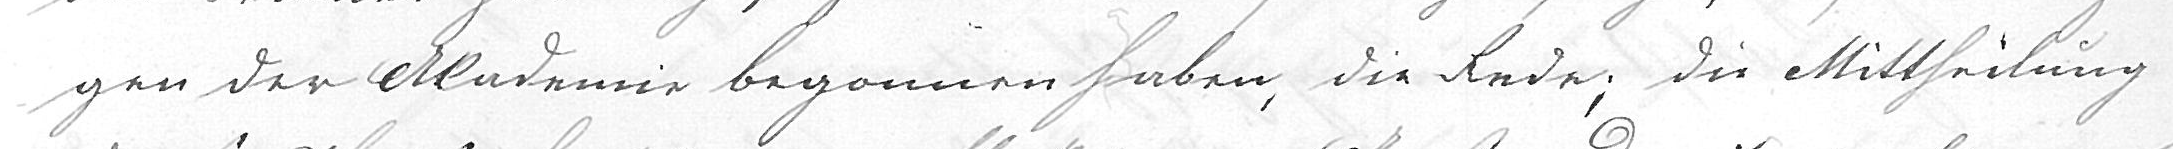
gen der Akademie begonnen haben, die Rede, die Mittheilung
